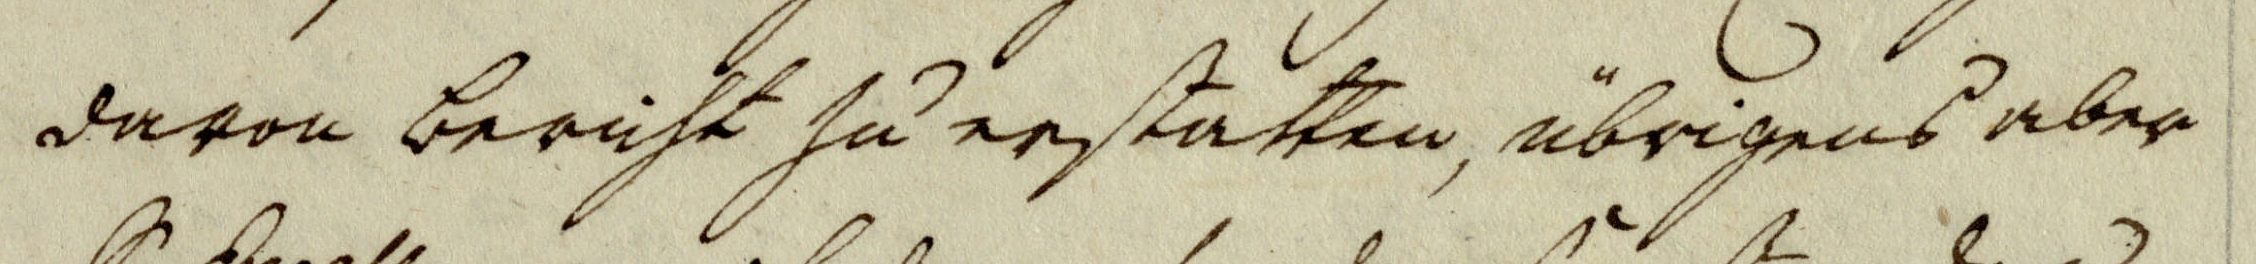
davon Bericht zu erstatten, übrigens aber
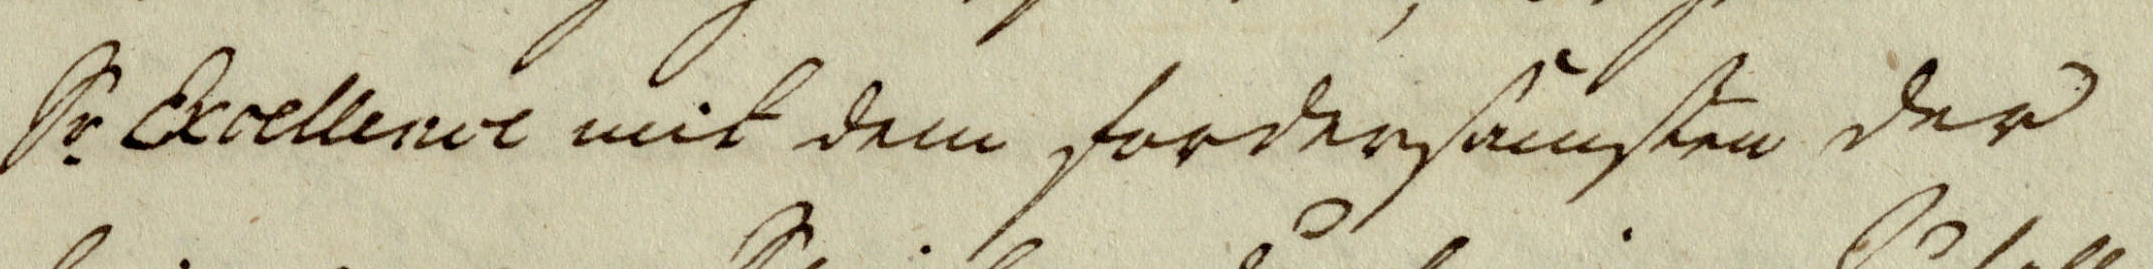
Sr Excellence mit dem fordersamsten der
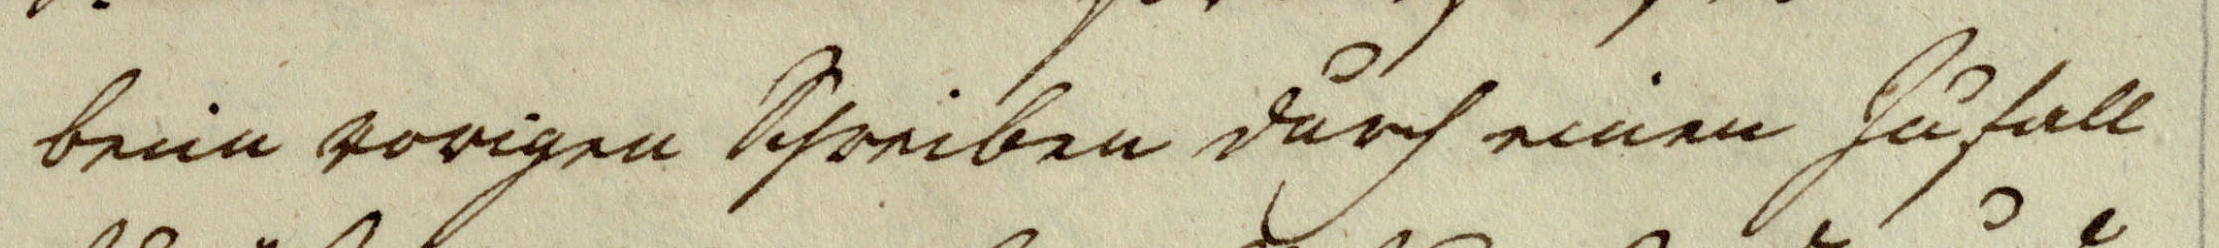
beim vorigen Schreiben durch einen Zufall
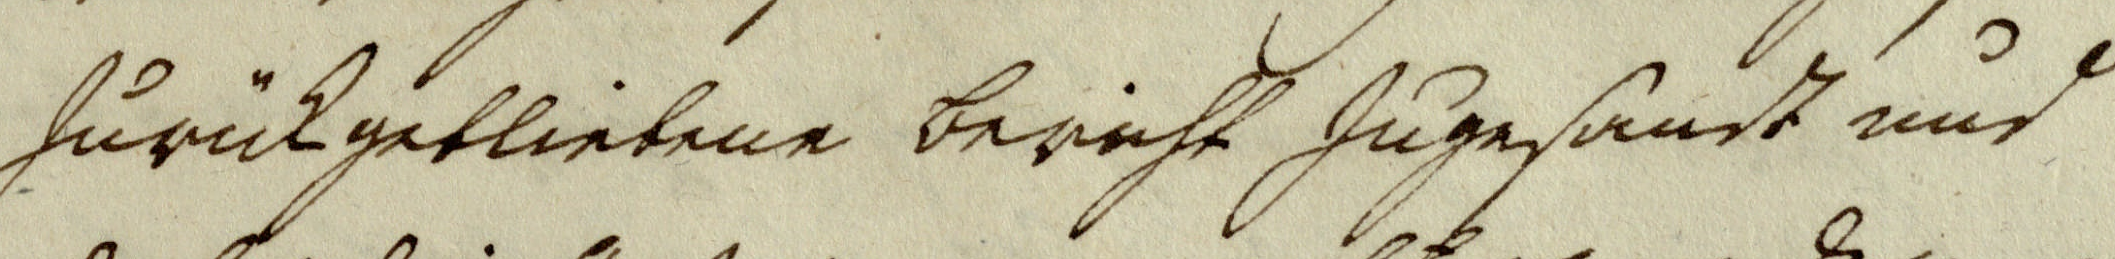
zurückgebliebene Bericht zugesandt und
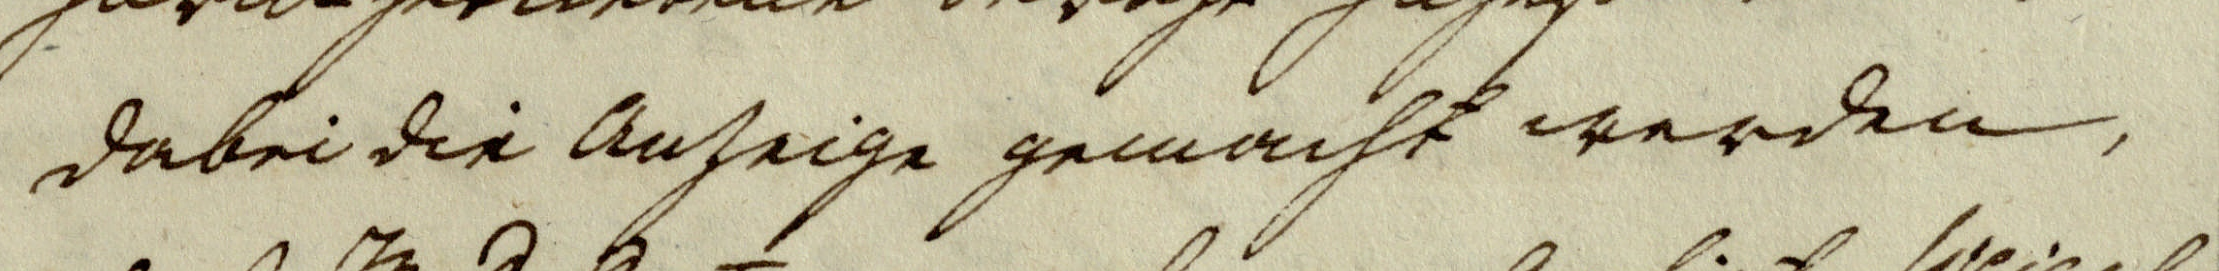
dabei die Anzeige gemacht werden,
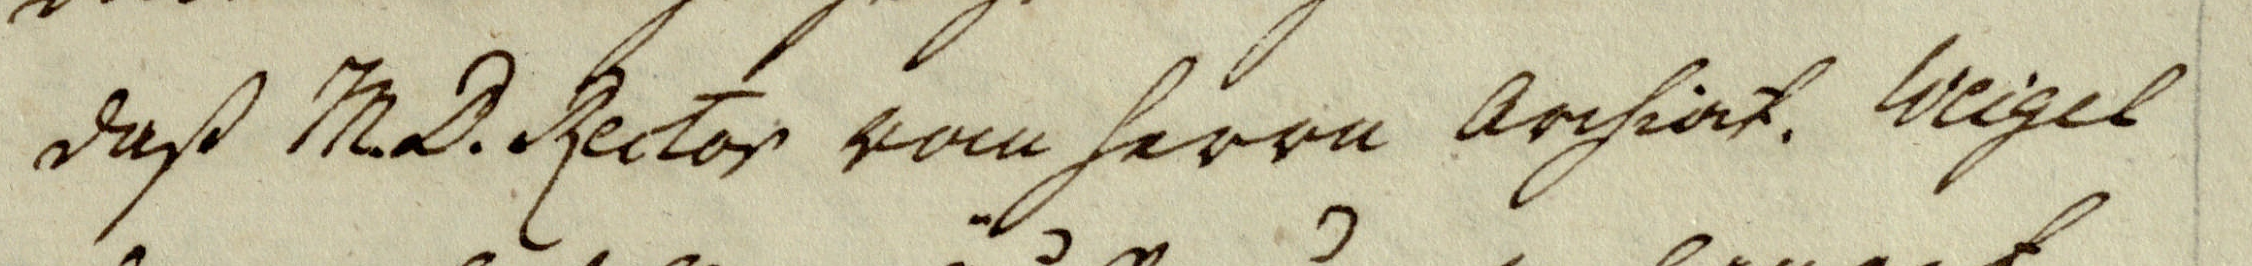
daß M D. Rector vom Herrn Archiat. Weigel
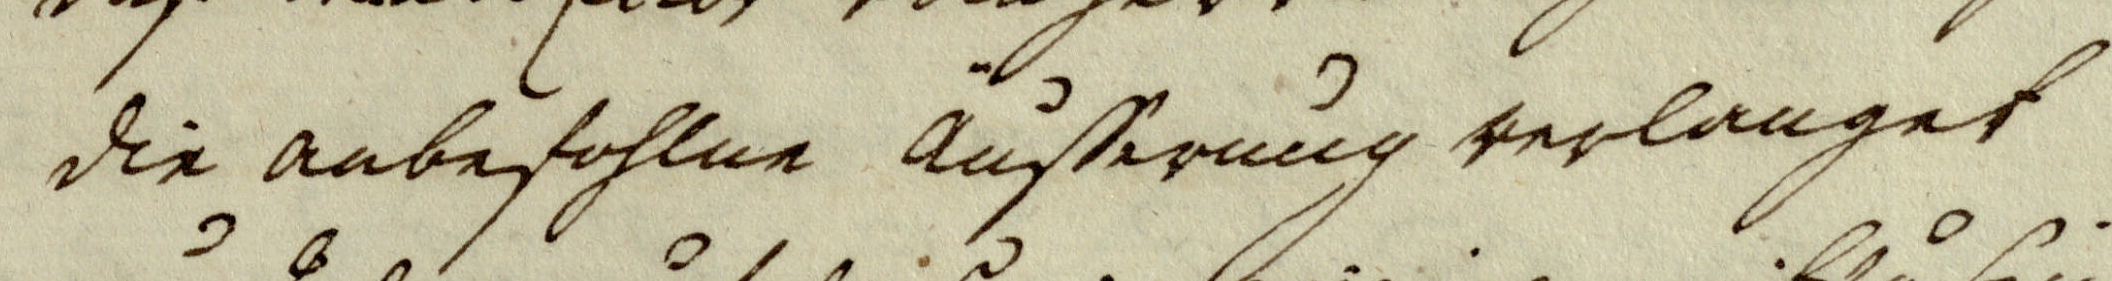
die anbefohlne Äusserung verlanget
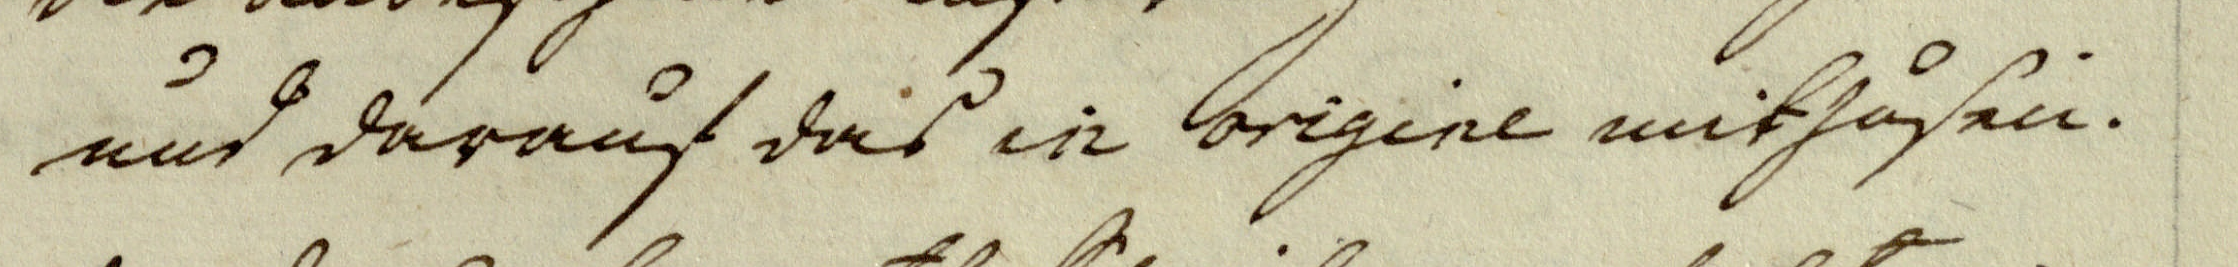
und darauf das in origine mitzusen¬
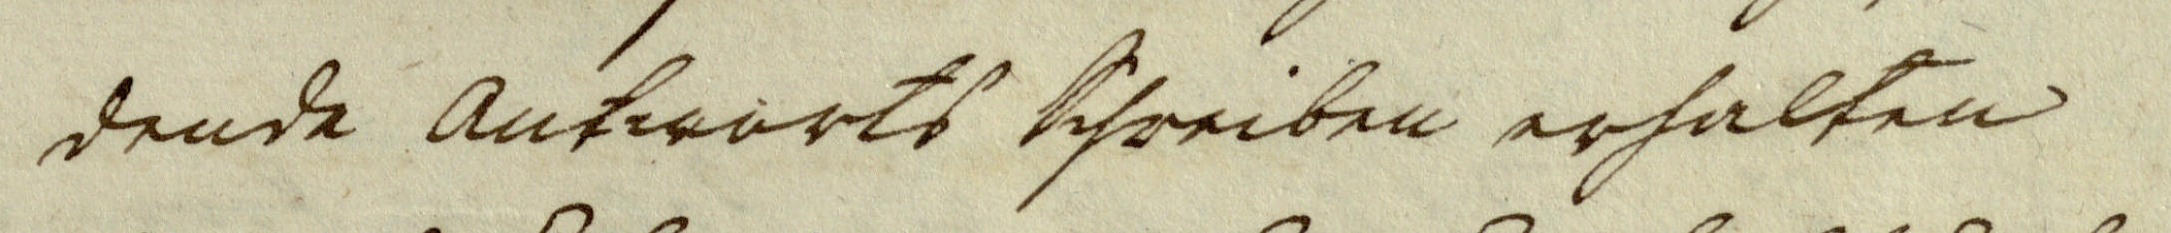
dende Antworts Schreiben erhalten
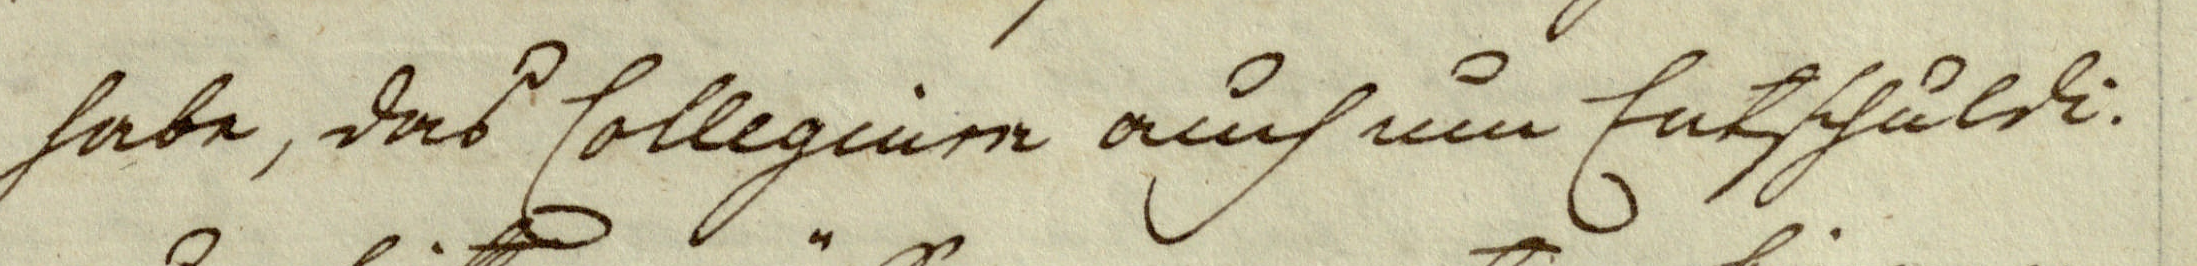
habe, das Collegium auch um Eatschuldi¬
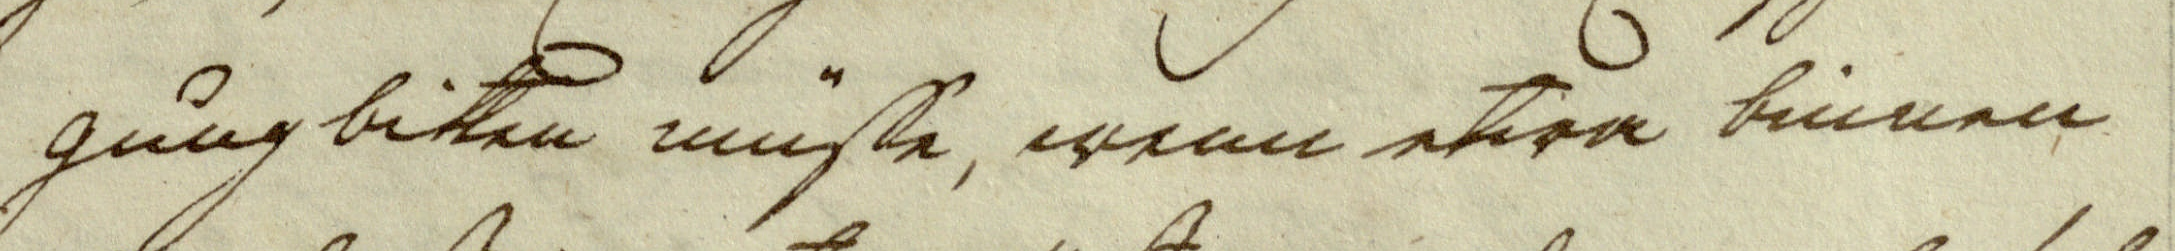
gung bitten müsse, wenn etwa binnen
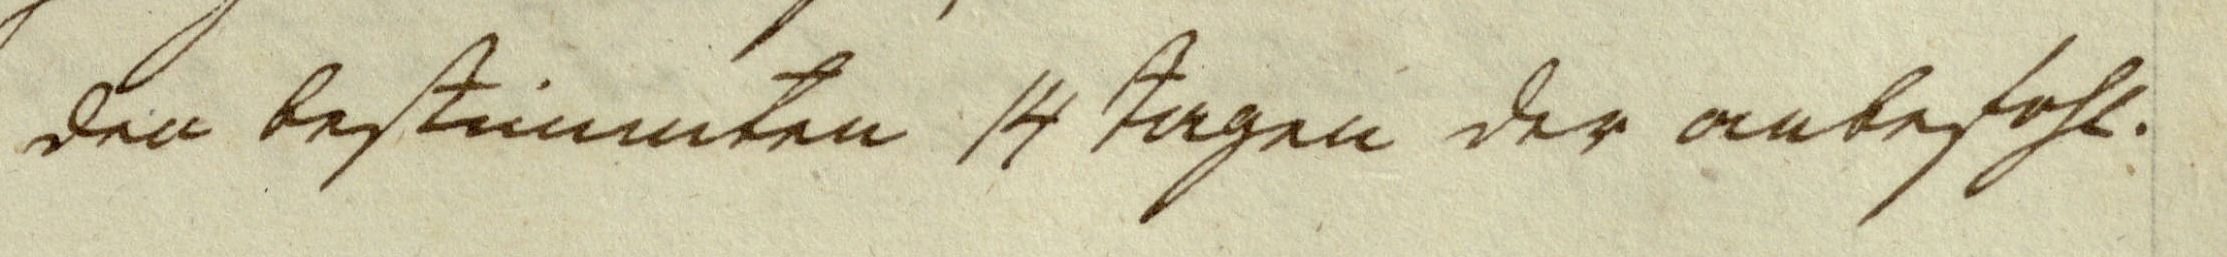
den bestimmten 14 Tagen der anbefohl¬
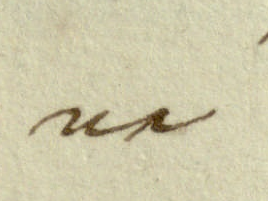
ne
